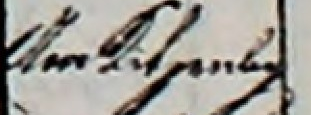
Am Kitzenbg
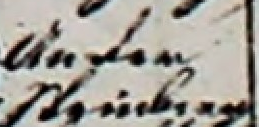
An der
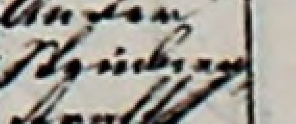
Steinberg„
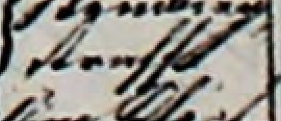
strasse
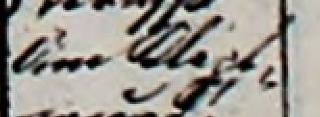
Am Klopf„
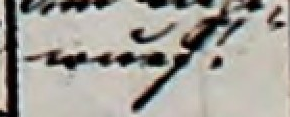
wurf.
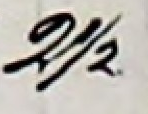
2 1/2
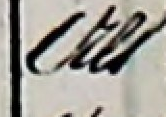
Alt
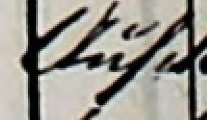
Aus„
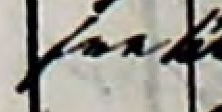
see
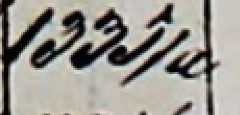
1335/a
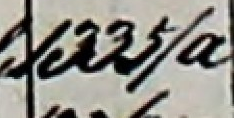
1335/a
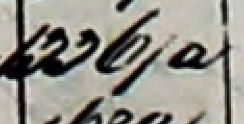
1336/a
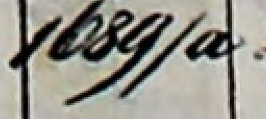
1689/a
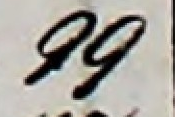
99
